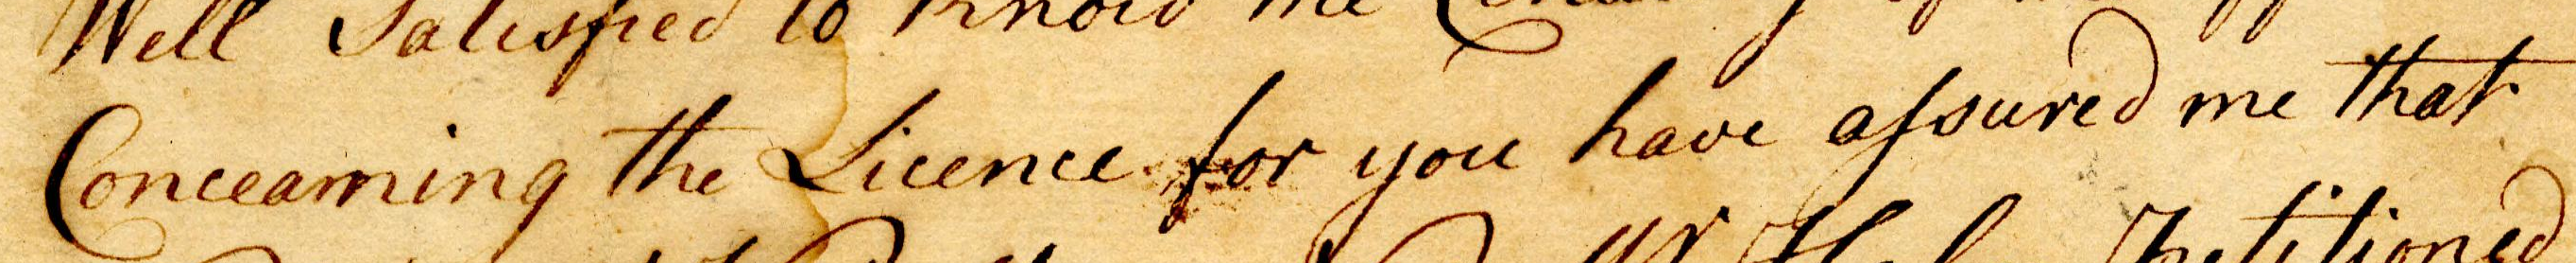Concerning the Licence for you have assured me that
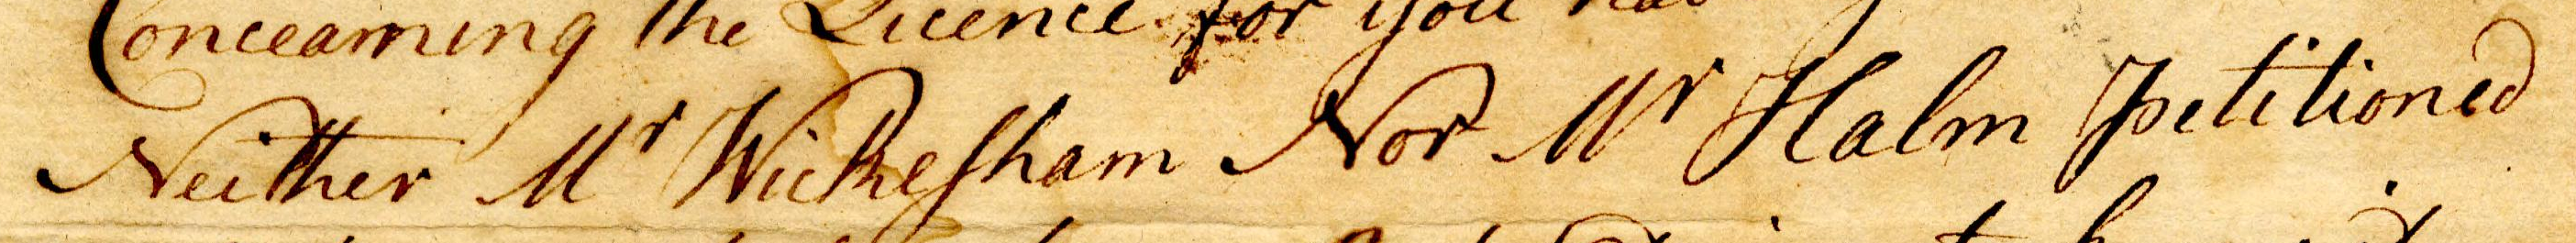Neither M^r Wickesham Nor M^r Halm petitioned
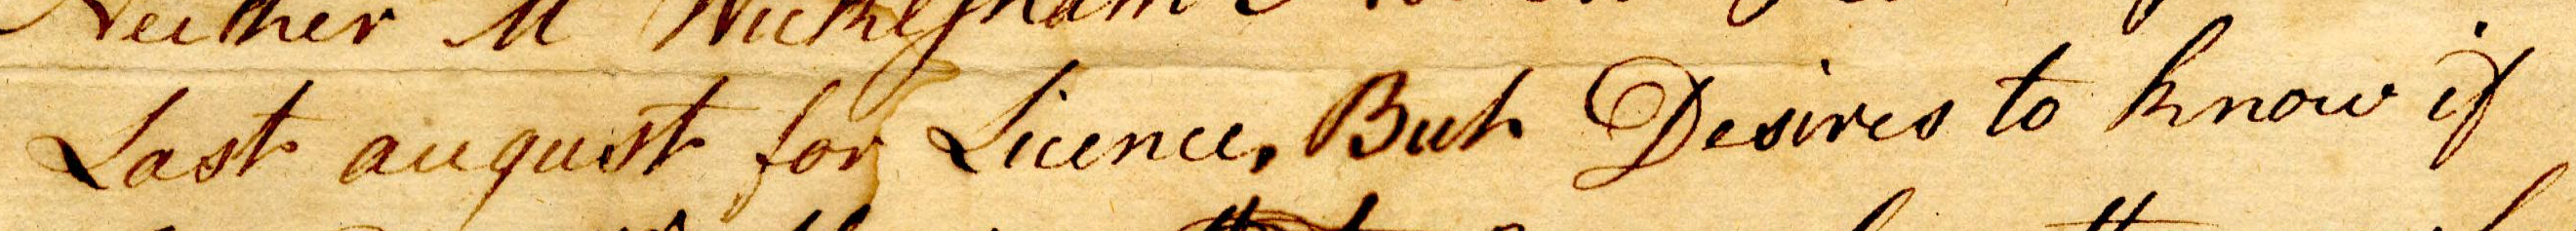Last august for Licence, But Desires to know if
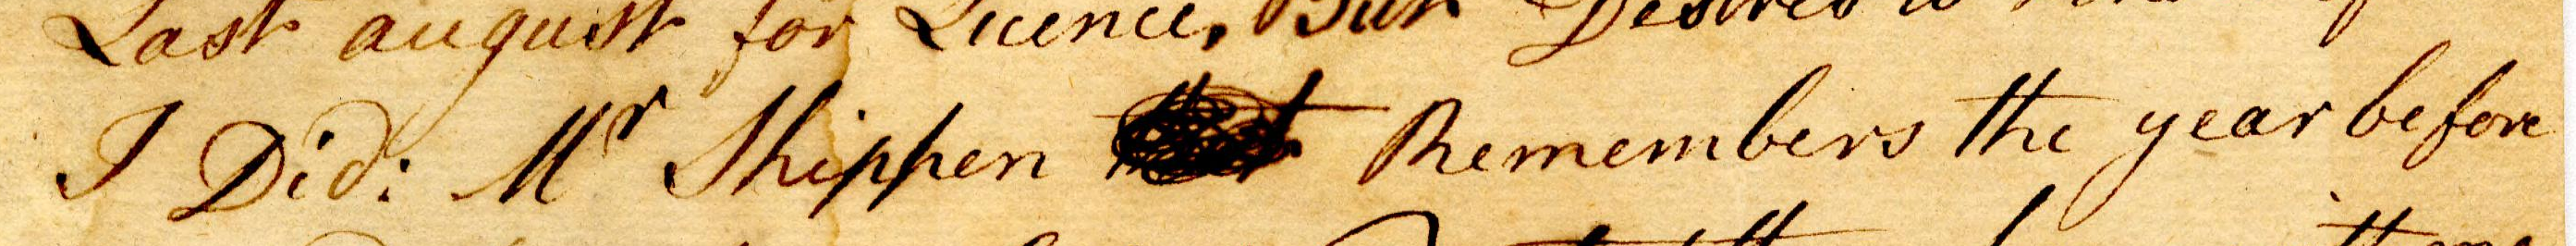I Did: M^r Shippen [___] Remembers the year before
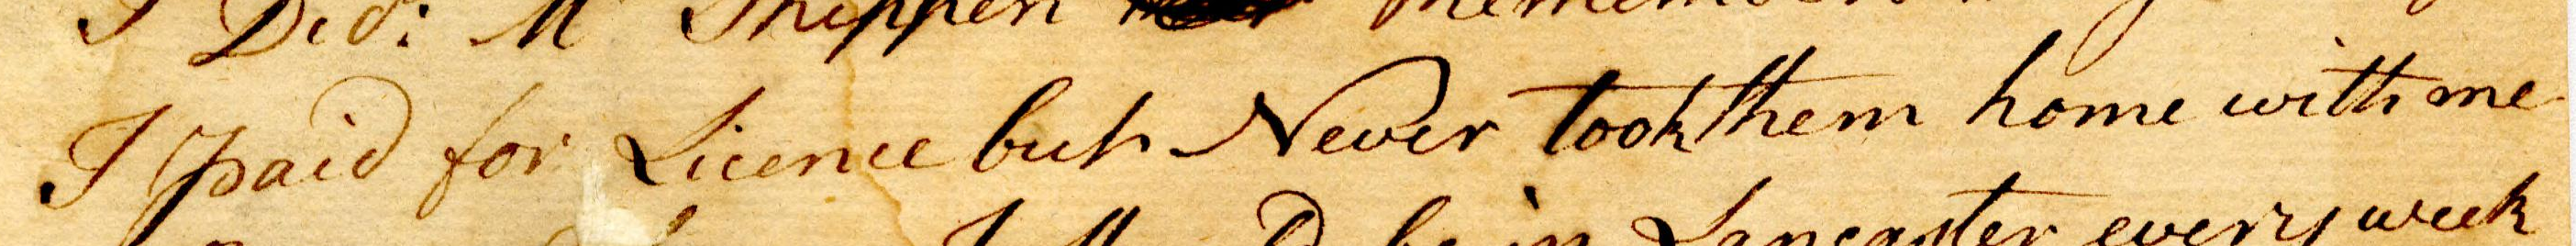I paid for Licence but Never took them home with me
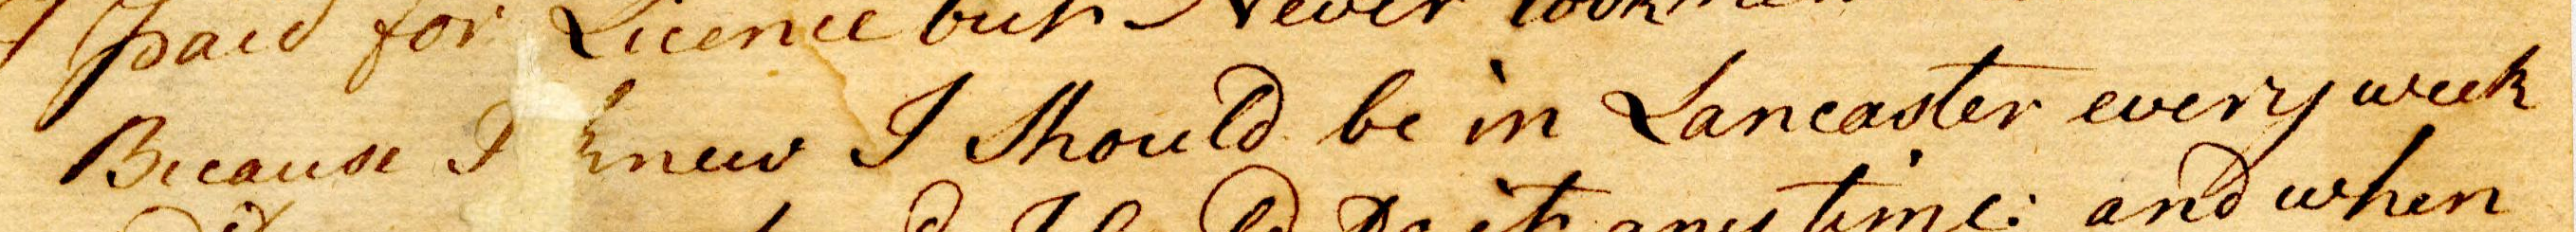Because I knew I should be in Lancaster every week
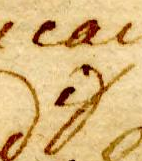if
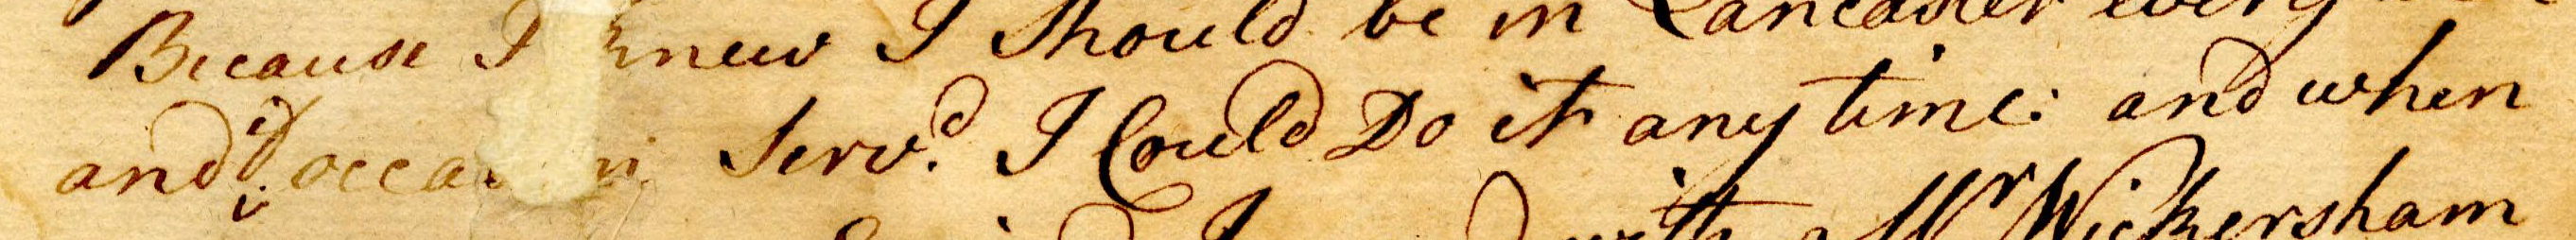and ^ occasion Serv^d. I could Do it any time: and when
